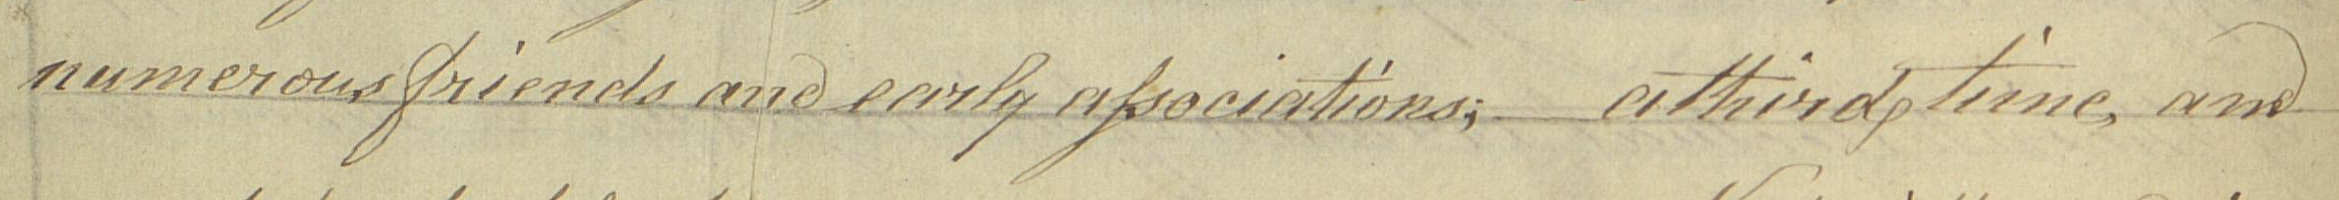numerous friends ard early associations; a third time, and
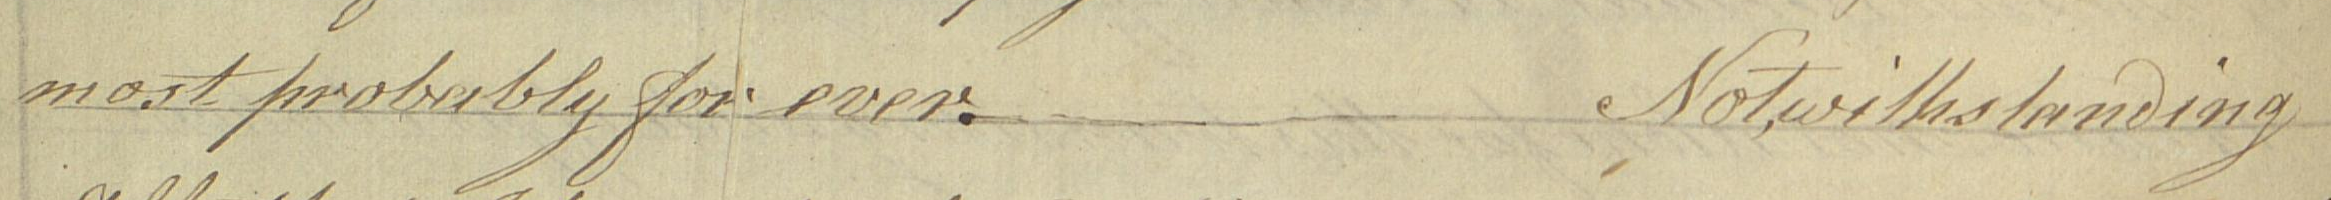most probably for ever. Notwithstanding
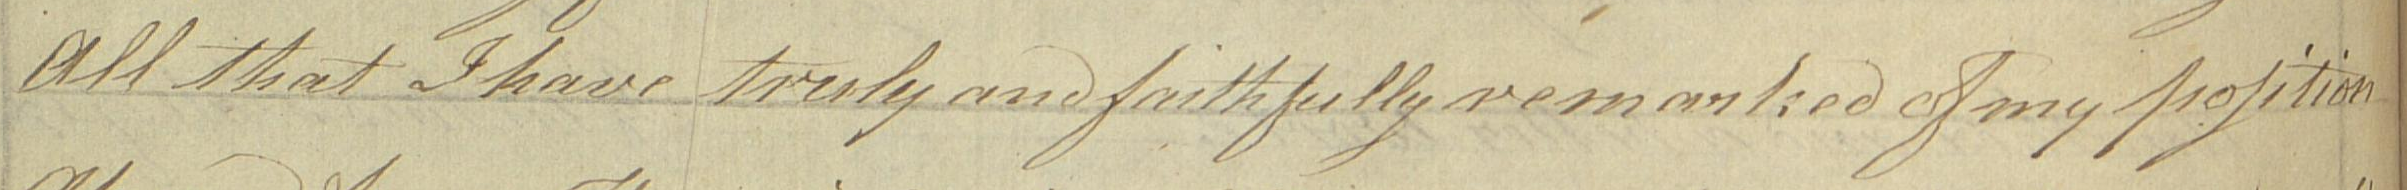All that I have truly and faithfully remarked of my position
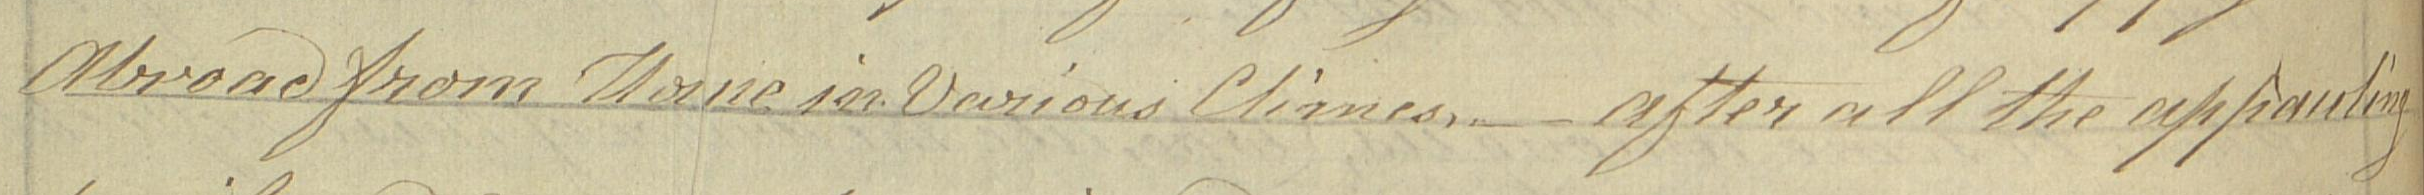Abroad from Home in Various Climes, after all the appauling
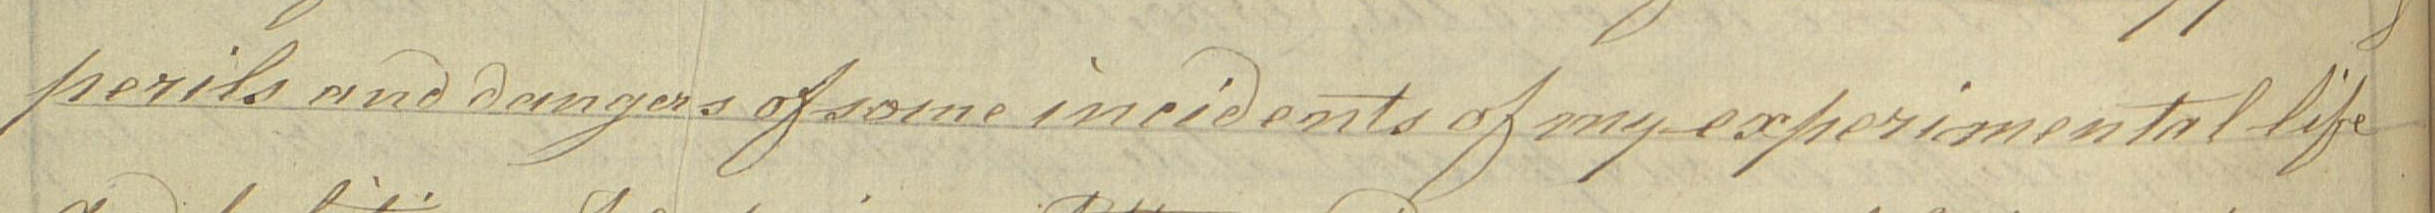perils and danger of some incidents of my experimental life
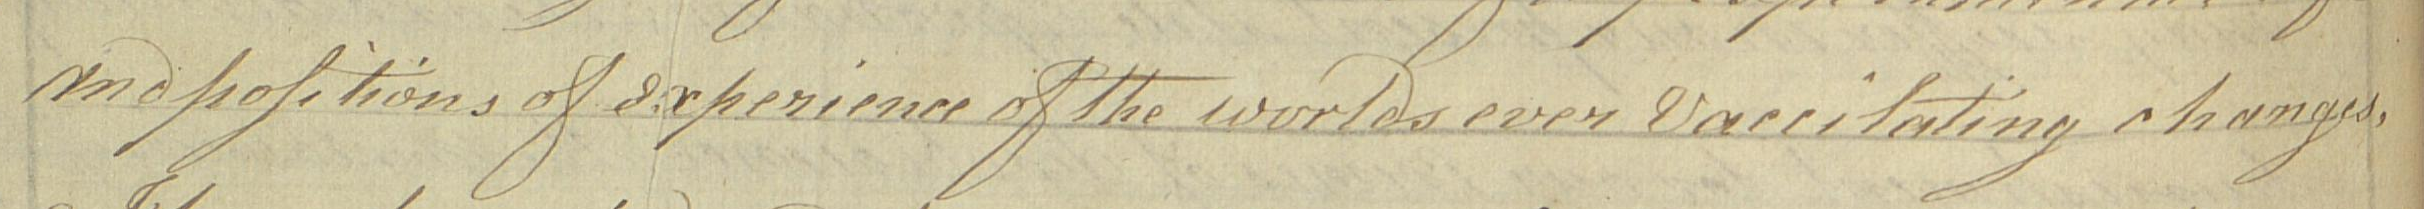and positions of experience of the worlds ever Vaccilating changes,
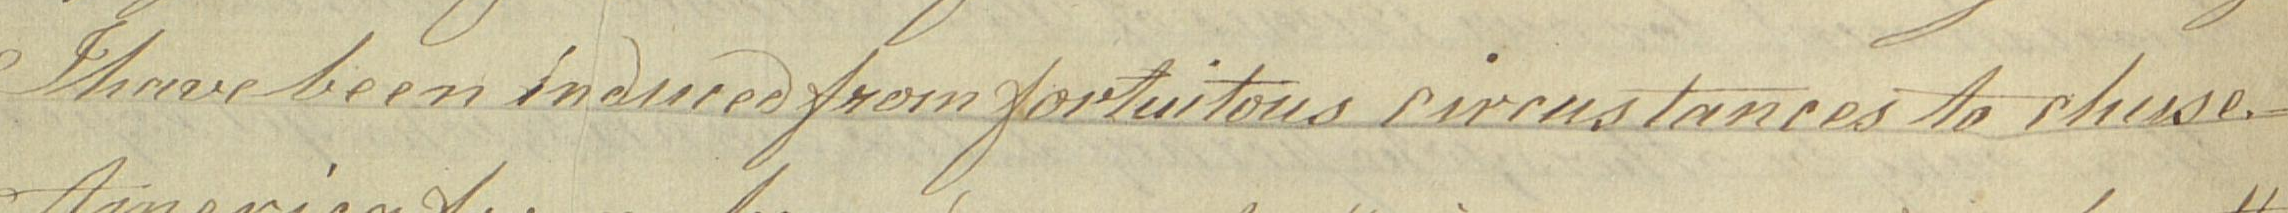I have been induced from fortuitous circumstances to chuse.
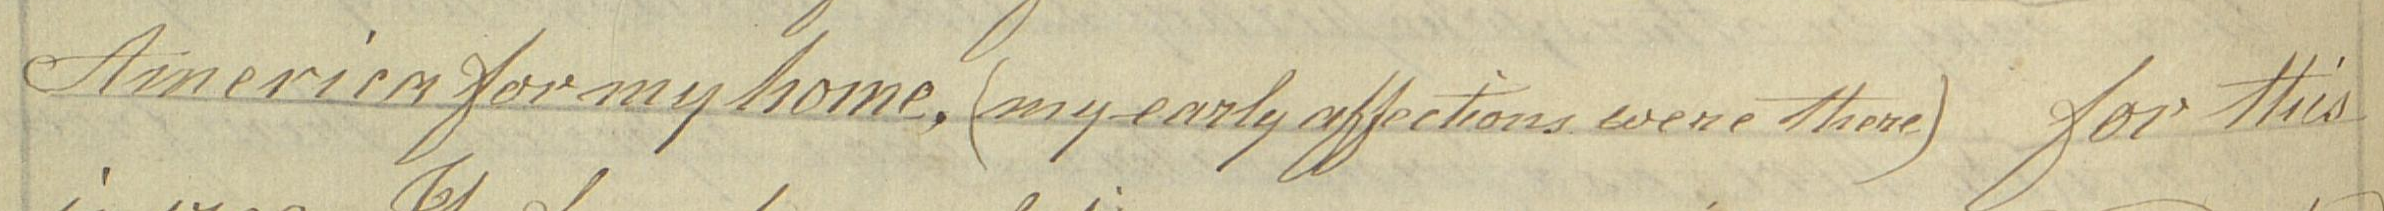America for my home, (my early affections were there) for this
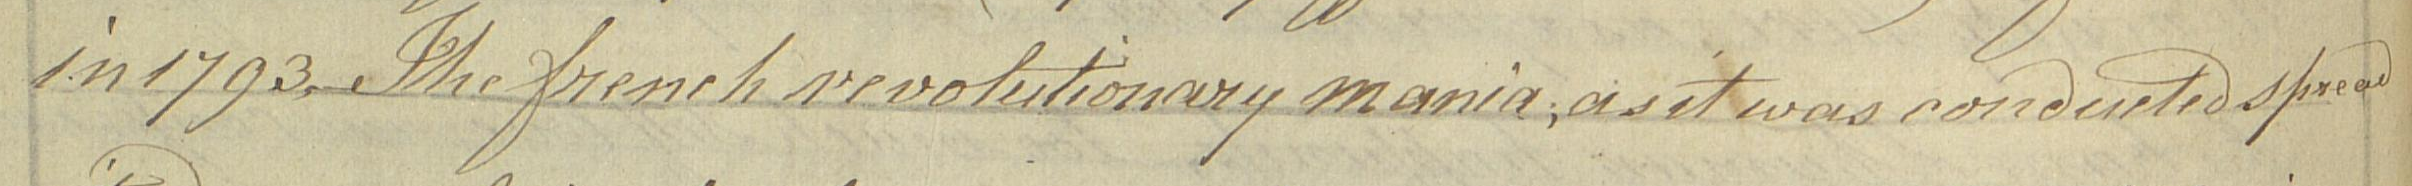in 1793. The french revolutionary mania, as it was conducted spread
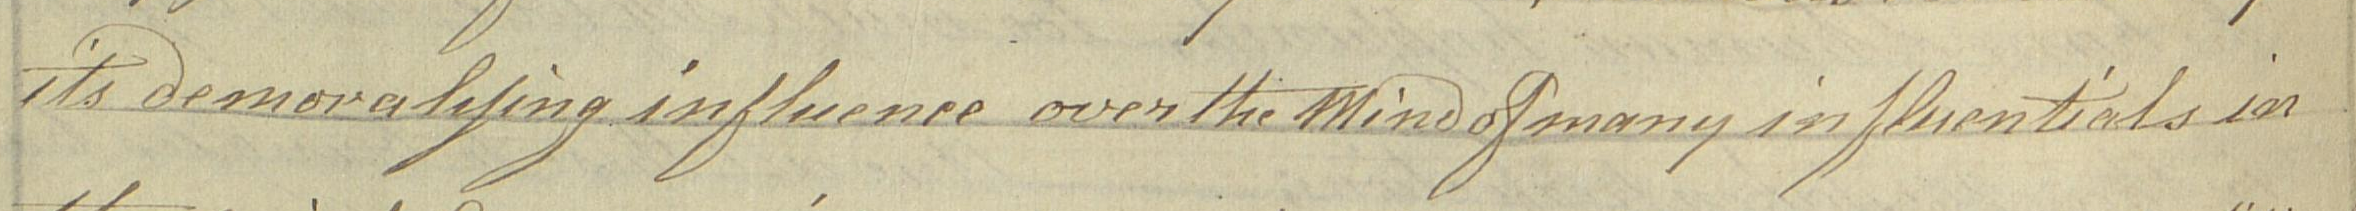its demoralising influence over the Mind of many influentials in
